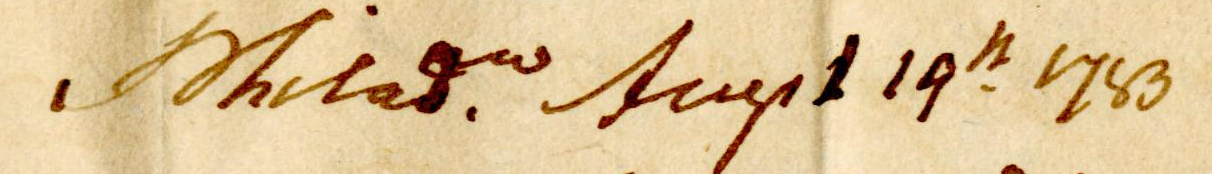Philad^a Aug^t 19^th. 1783
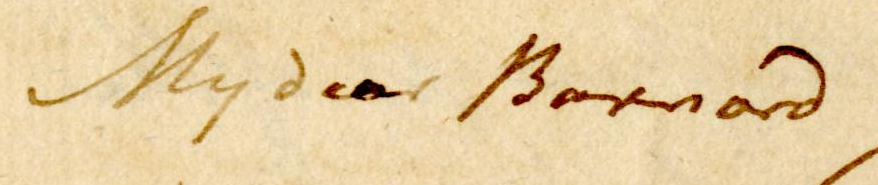My dear Barnard
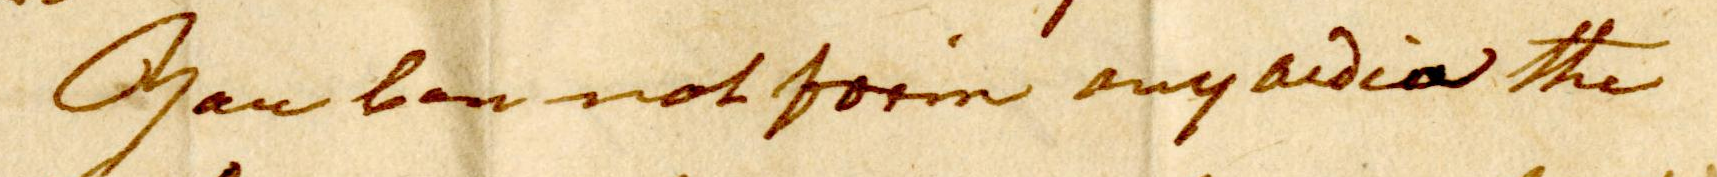You Can not form any advice the
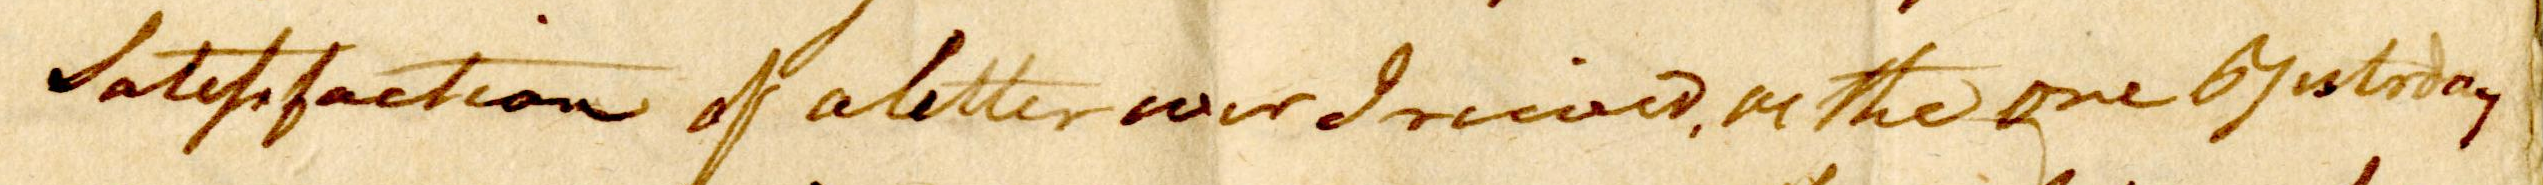Satissfaction of a letter ever I received, as the one yesterday
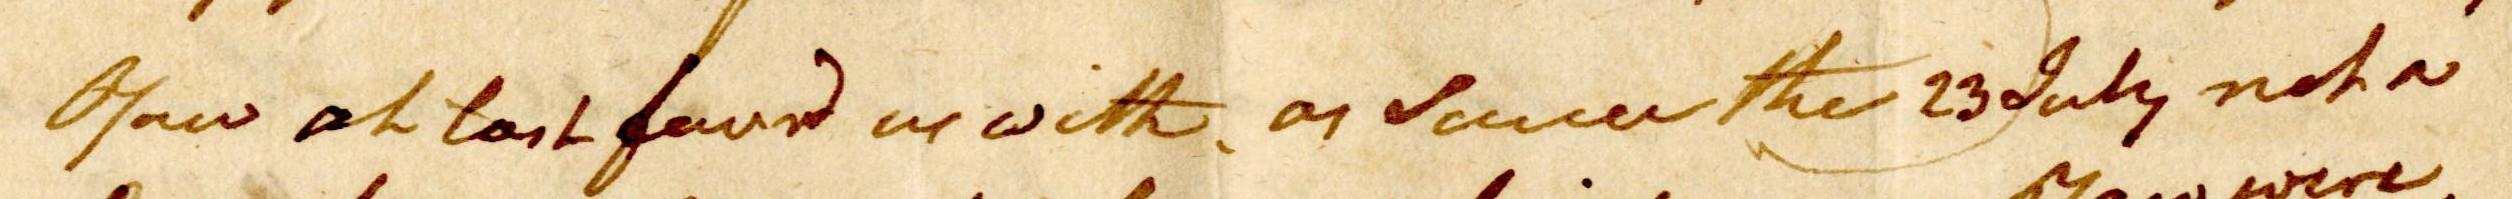you at last fav^rd us with, as saver the 23 July not a
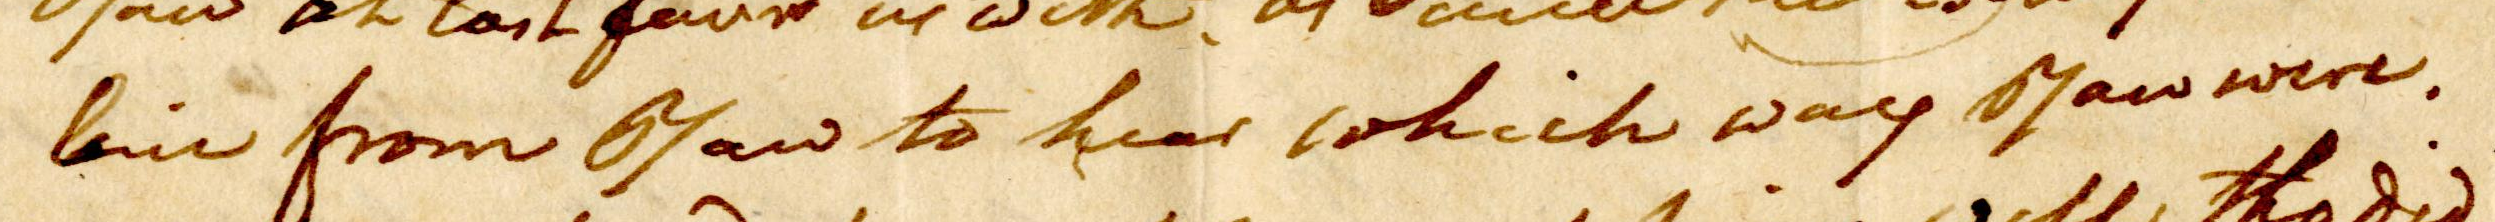line from you to hear which way you were.
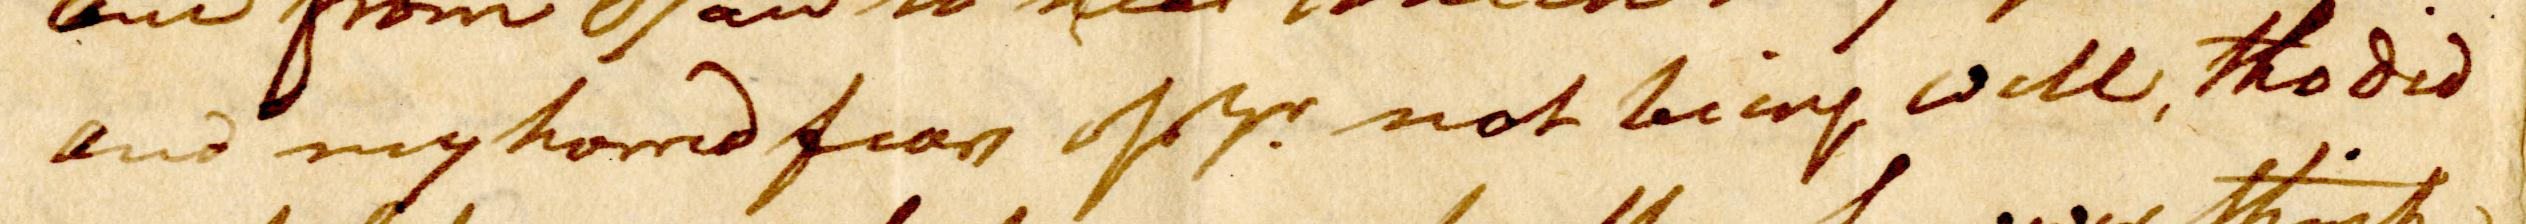and my horrid fear of y^r. not being well, tho did
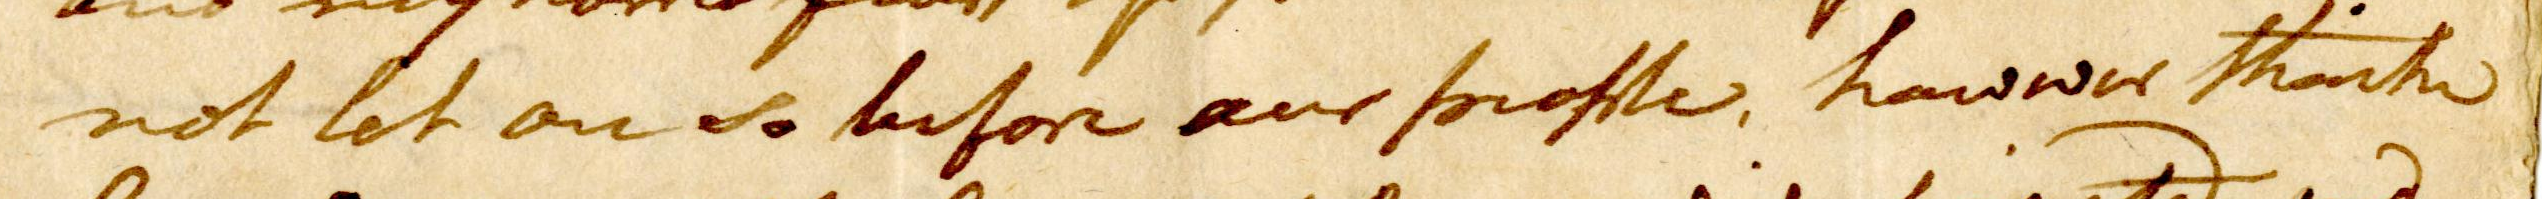not let on so before our brother, however thank
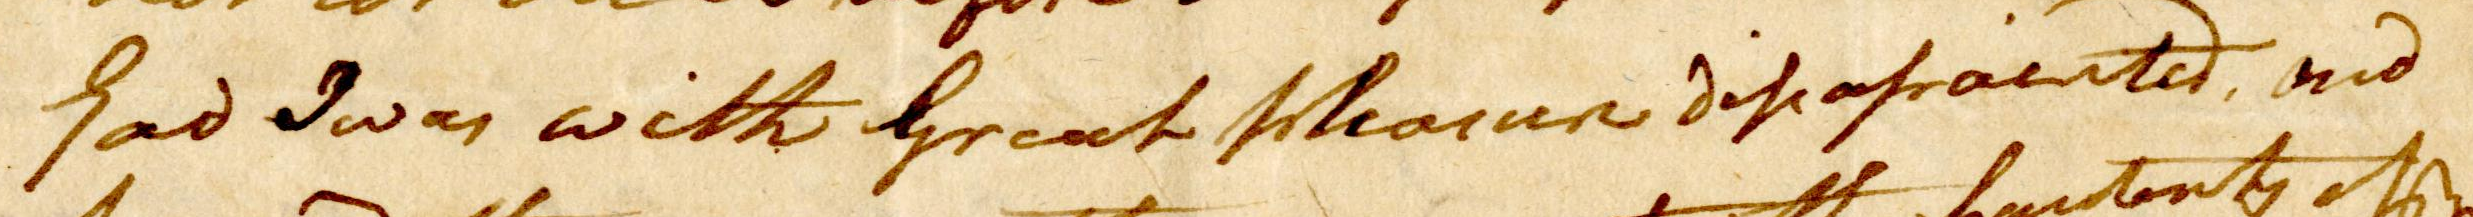God I was with Great pleasure disapointed, and
